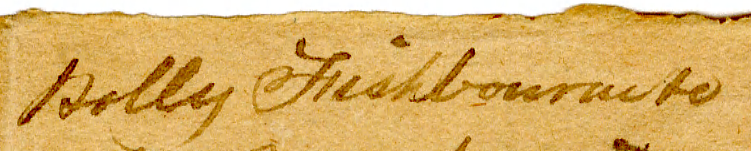Polly Fishbourne to
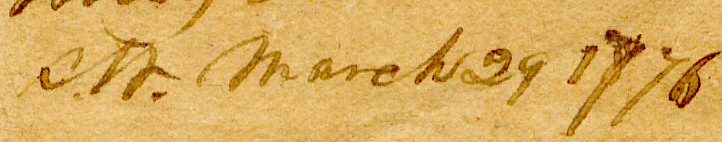S.W. March 29 1776
